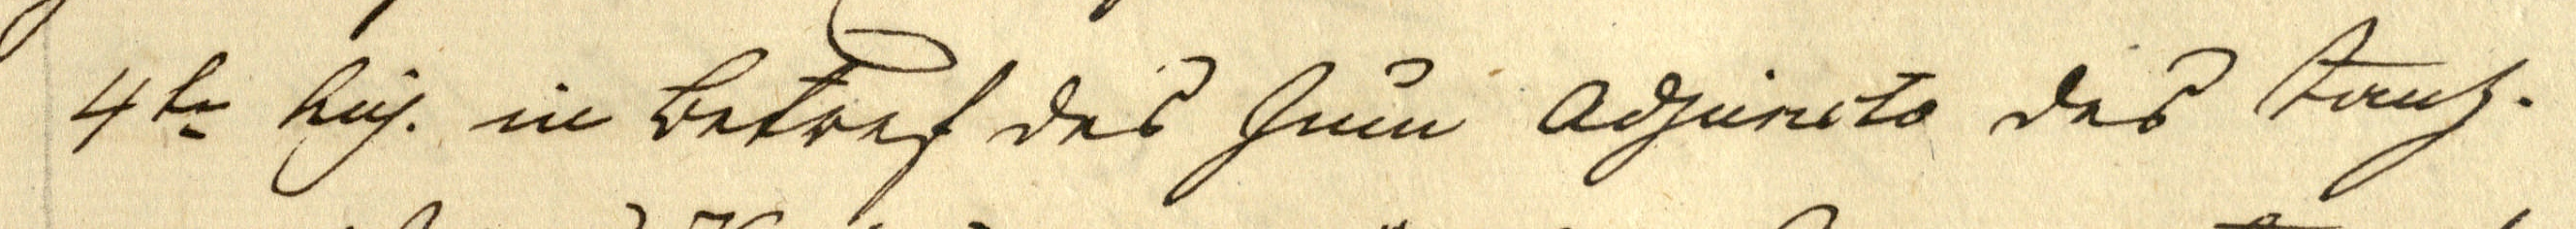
4ten huj. in Betref des zum Adjuncto des Tanz-
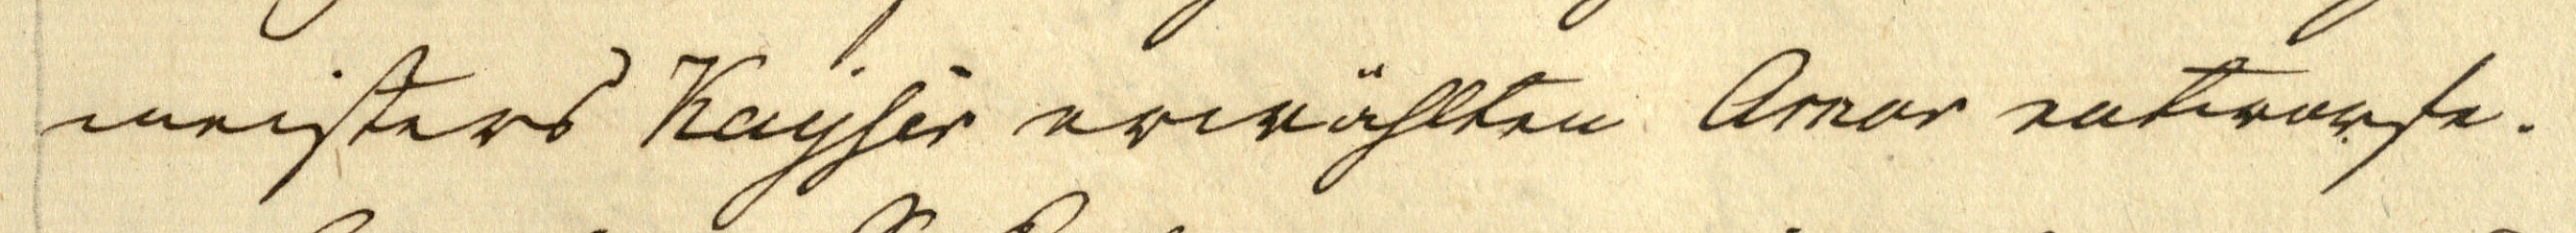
meisters Kayser erwählten Amor entworfe-
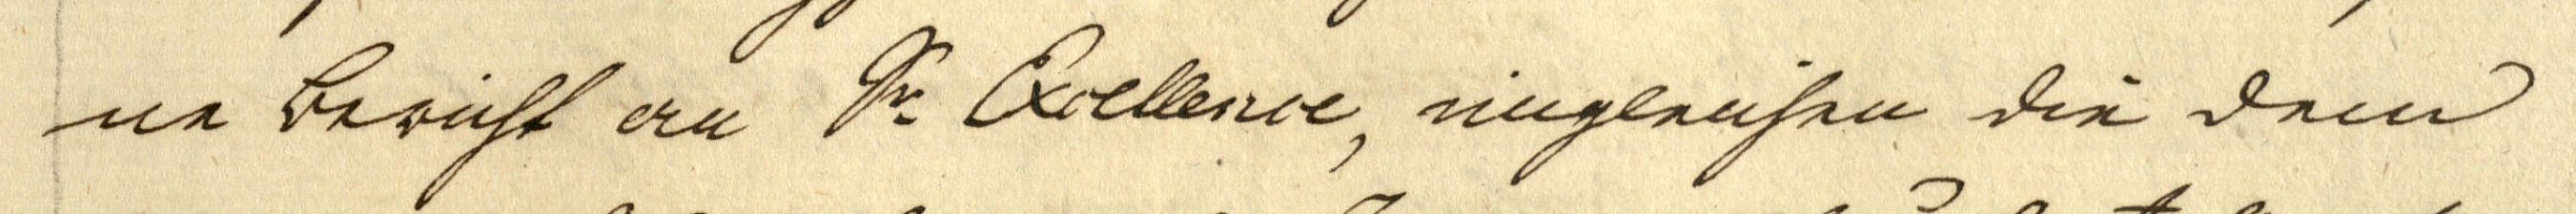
ne Bericht an Sr. Excellence, im gleichen die dem
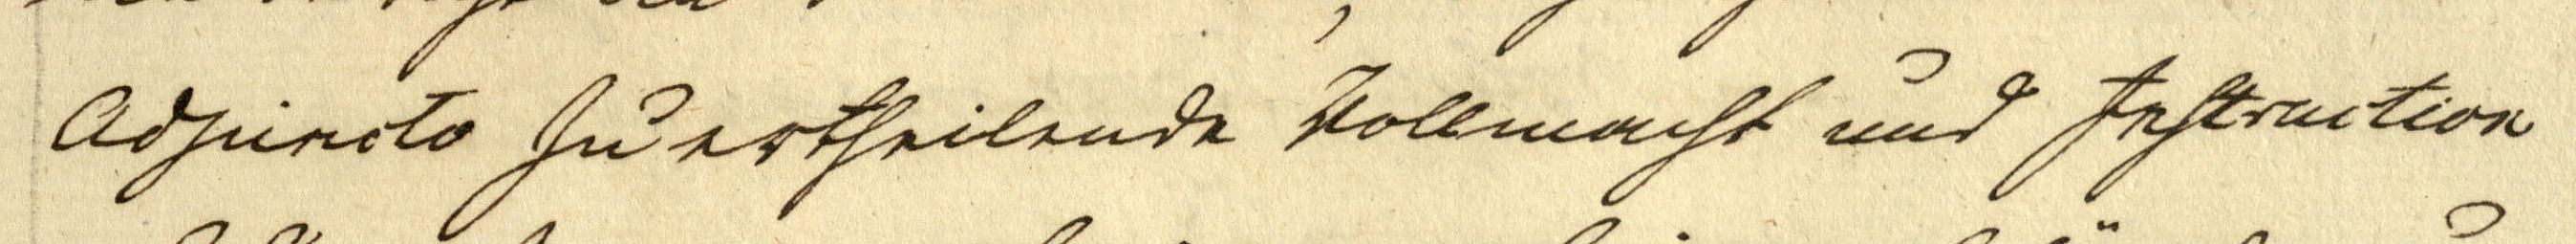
Adjuncto zu ertheilenden Vollmacht und Instruction
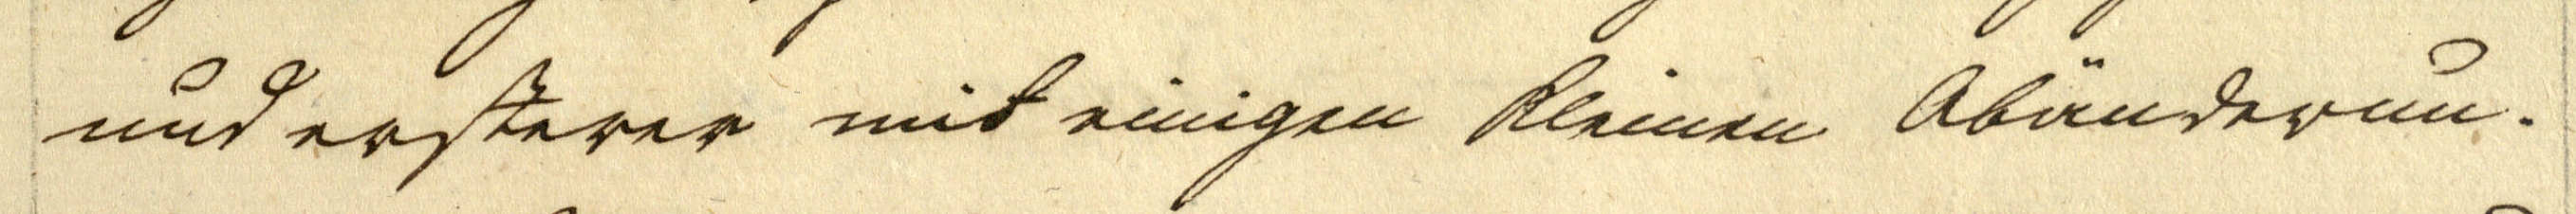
und ersterer mit einigen kleinen Abänderun-
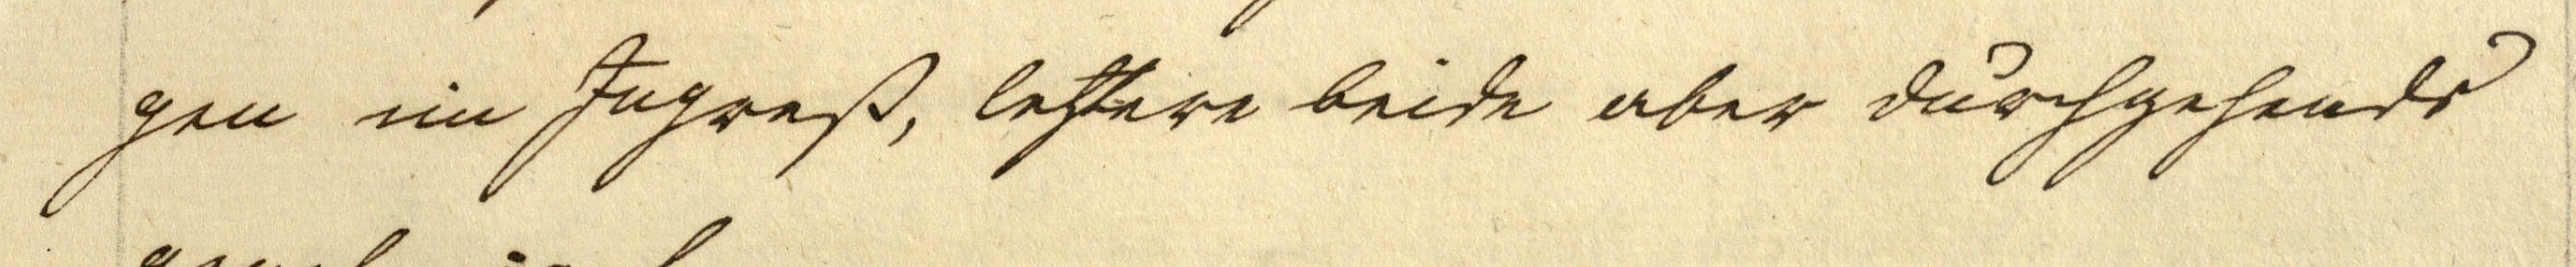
gen im Ingreß, letztere beide aber durchgehende
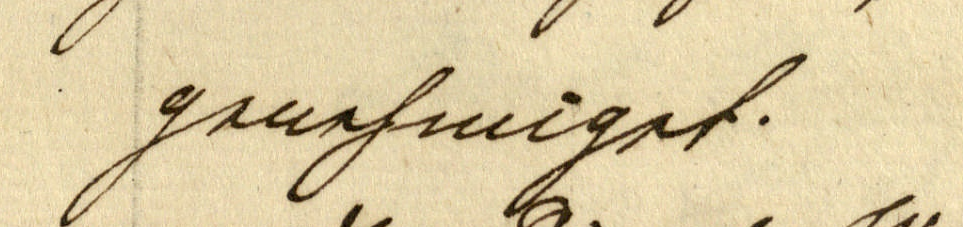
genehmiget.
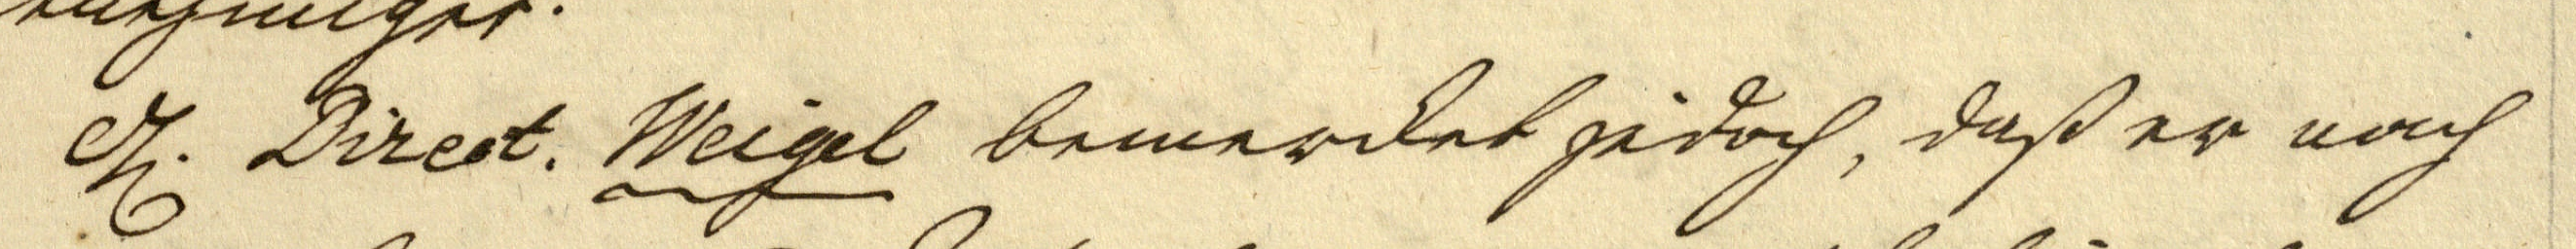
dh. Direct. Weigel bemerket jedoch, daß er nach
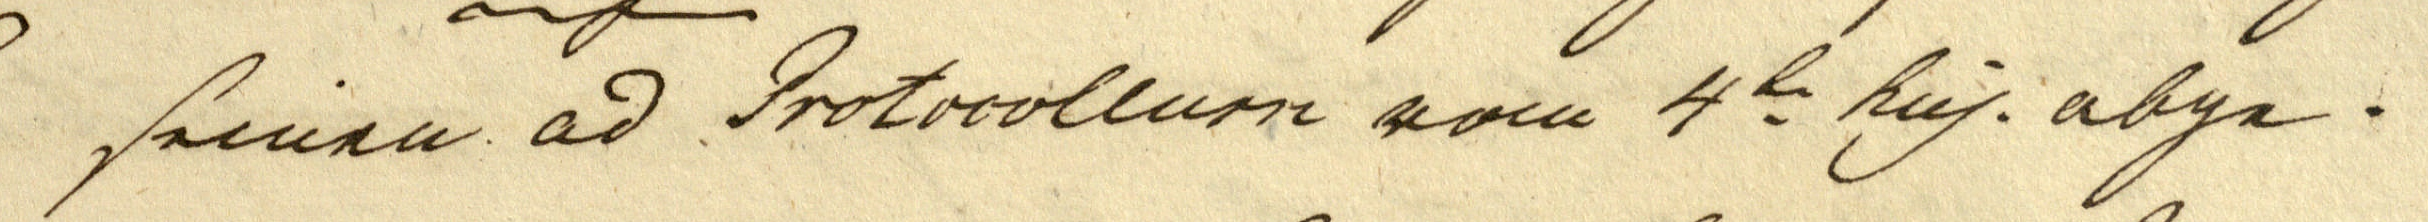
seinen ad protocollum vom 4ten huj. abge-
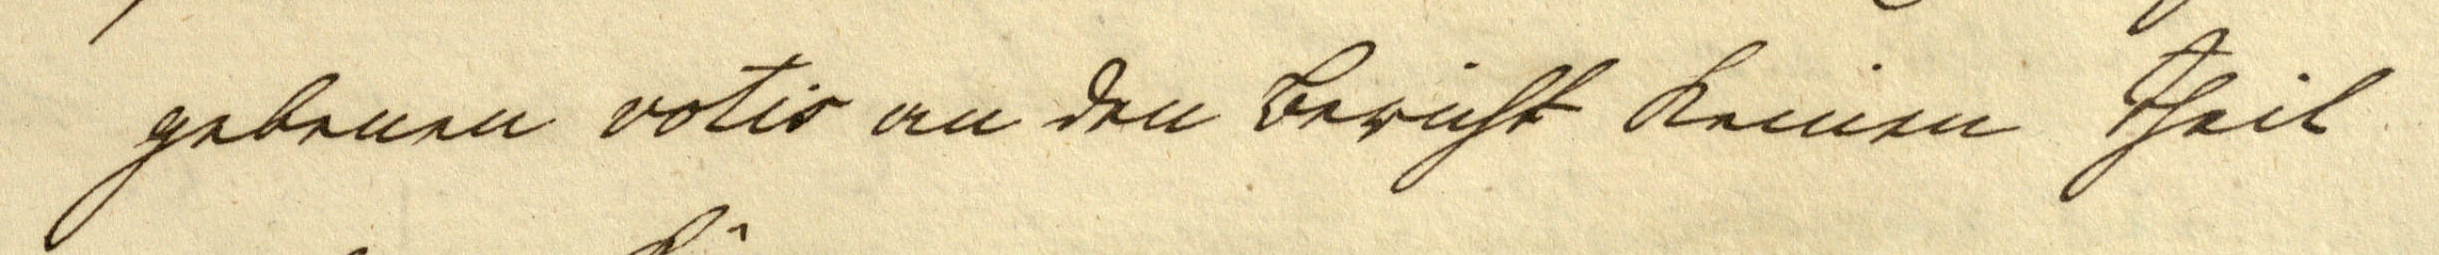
gebenen votis an den Bericht keinen Theil
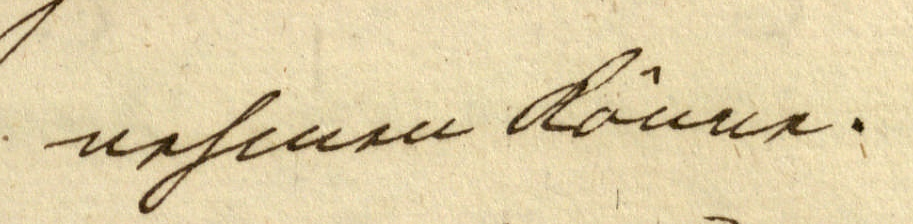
nehmen könne.
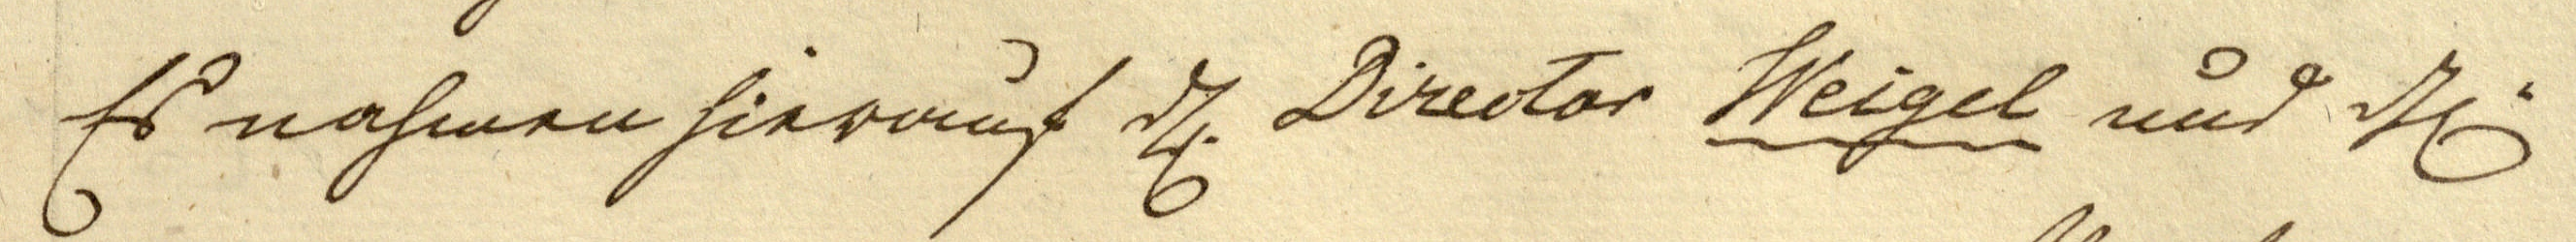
Es nahmen hierauf dh. Director Weigel und dh.
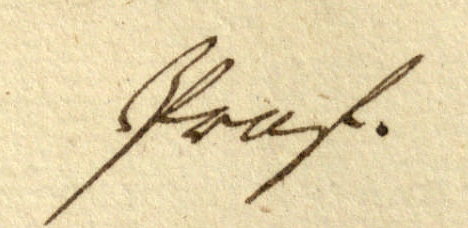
Prof.
